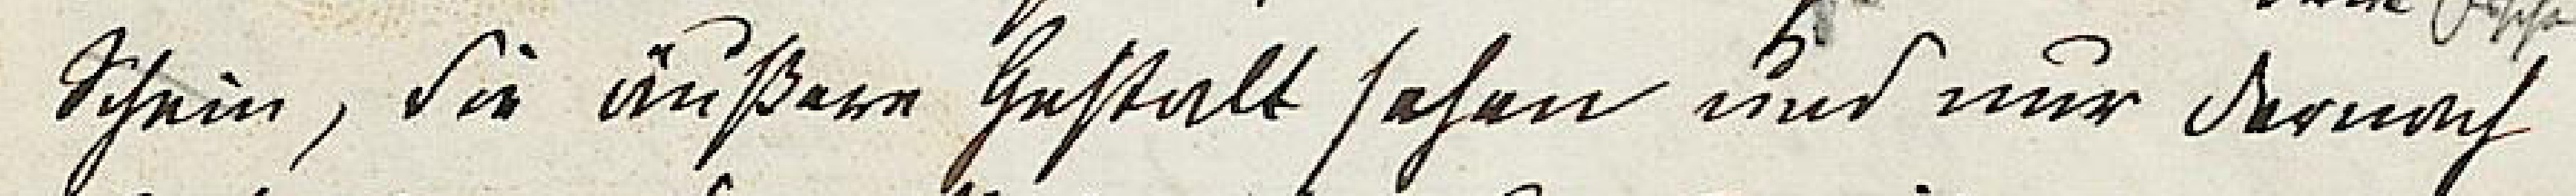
Schein, die äußere Gestalt sehen und nur dernach
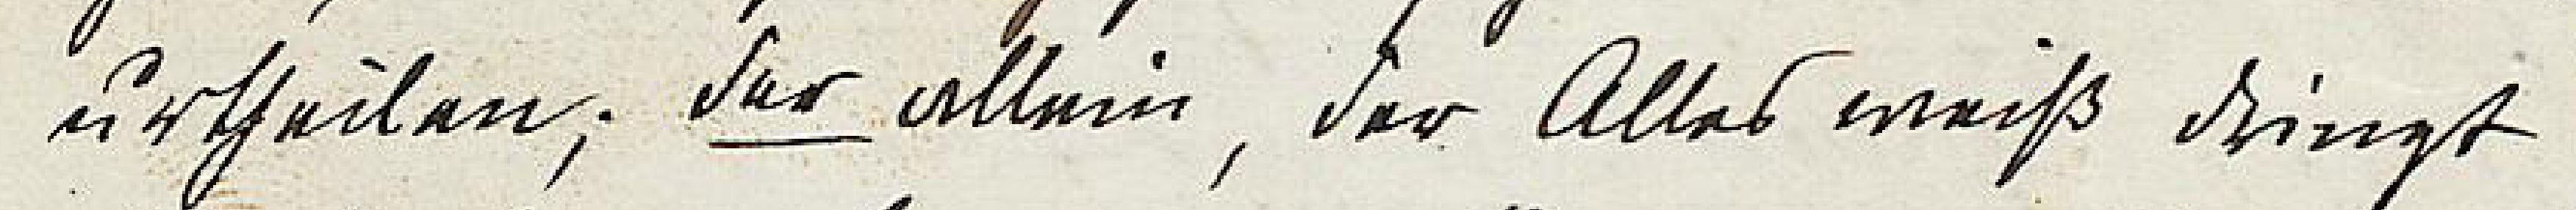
urtheilen; der allein, der Alles weiß dringt
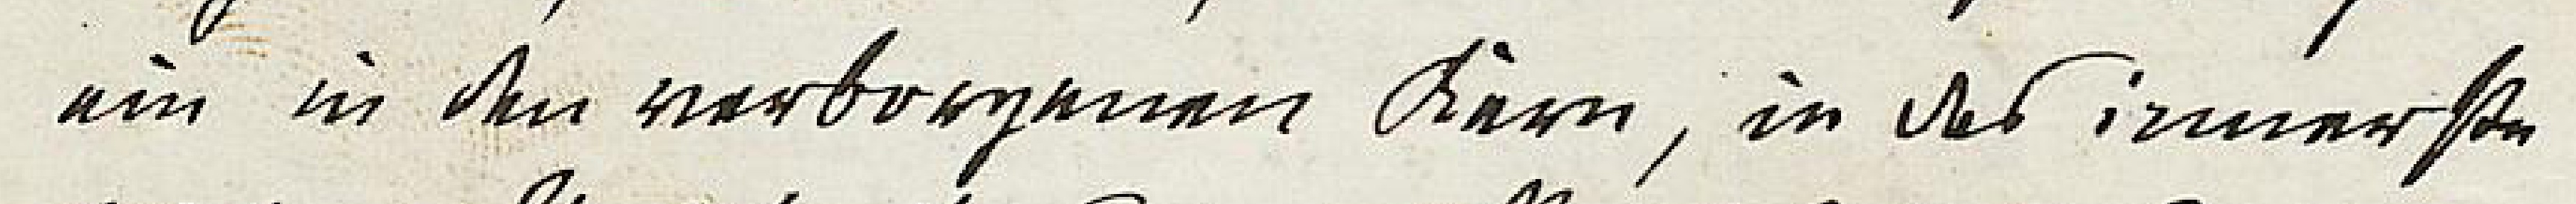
ein in den verborgenen Kern, in das innerste
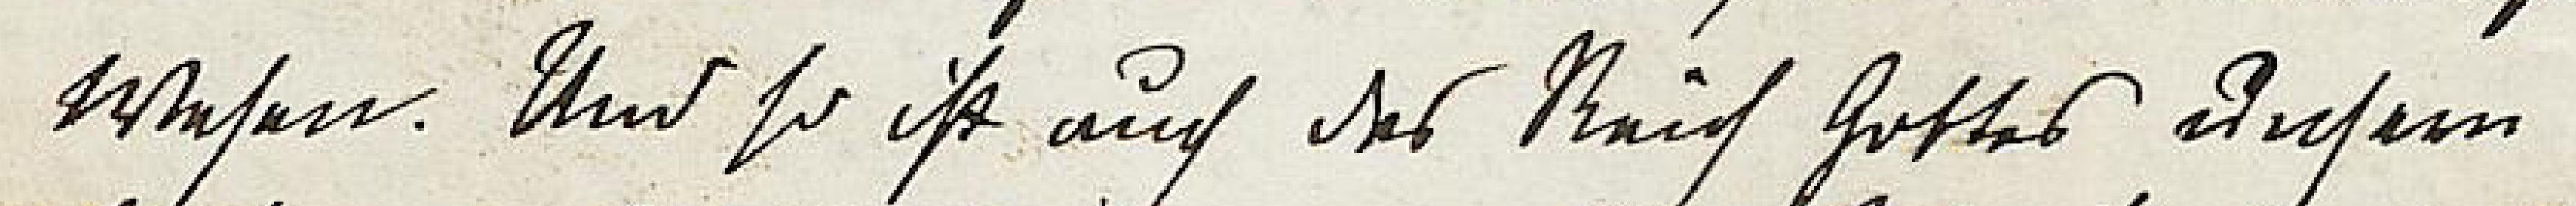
Wesen. Und so ist auch das Reich Gottes unsern
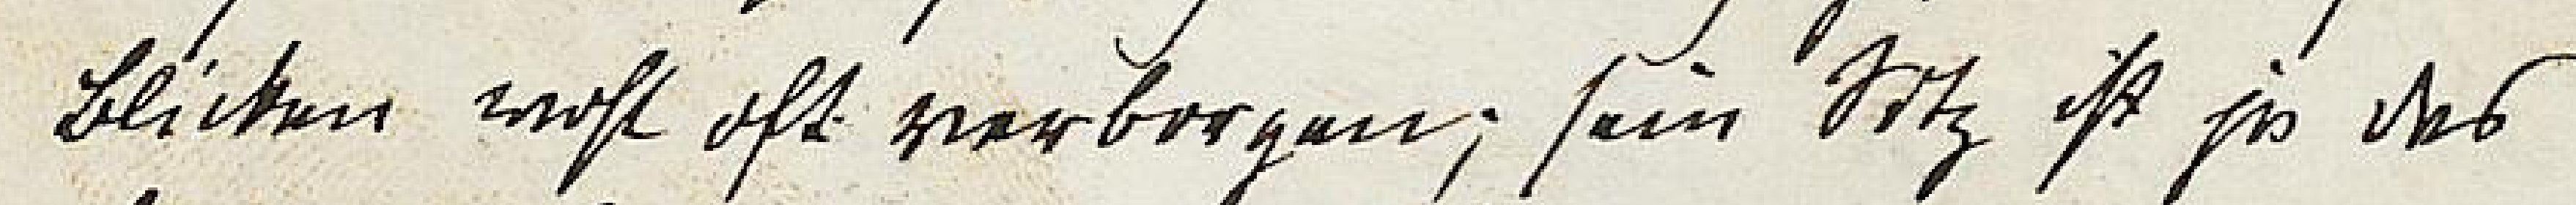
Blicken wohl oft verborgen; sein Sitz ist ja das
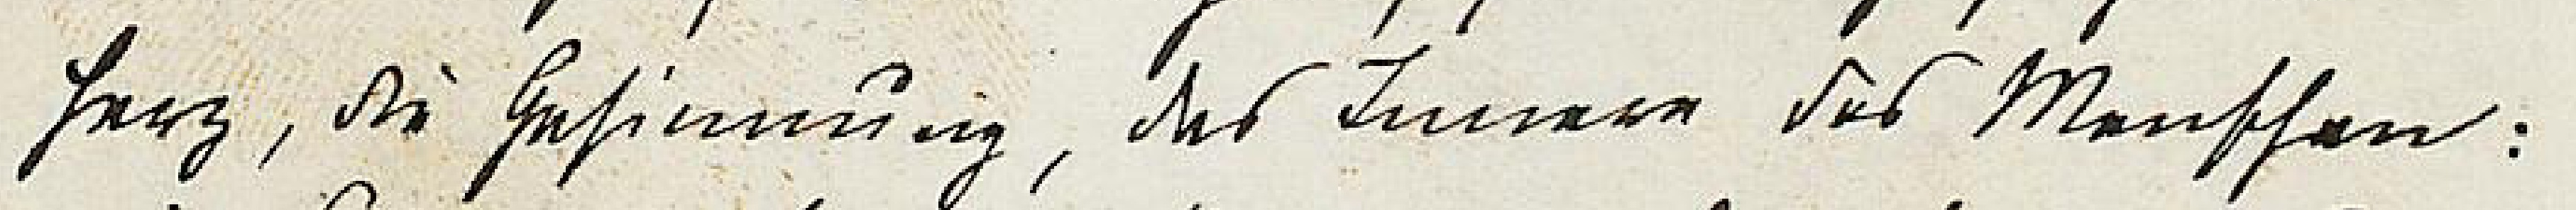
Herz, die Gesinnung, das Innere des Menschen:
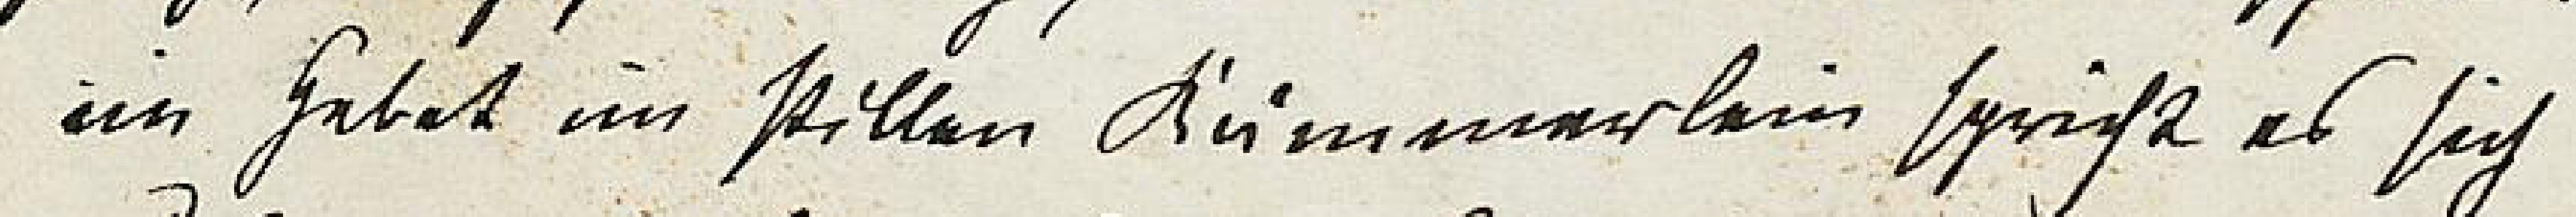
im Gebet im stillen Kämmerlein spricht es sich
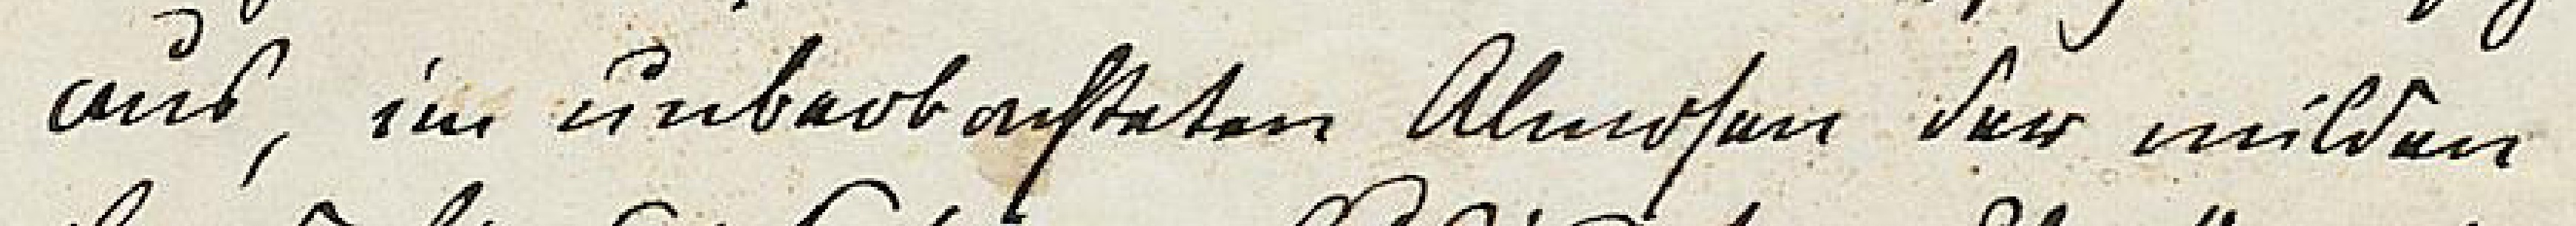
aus, im unbeobachteten Almosen der milden
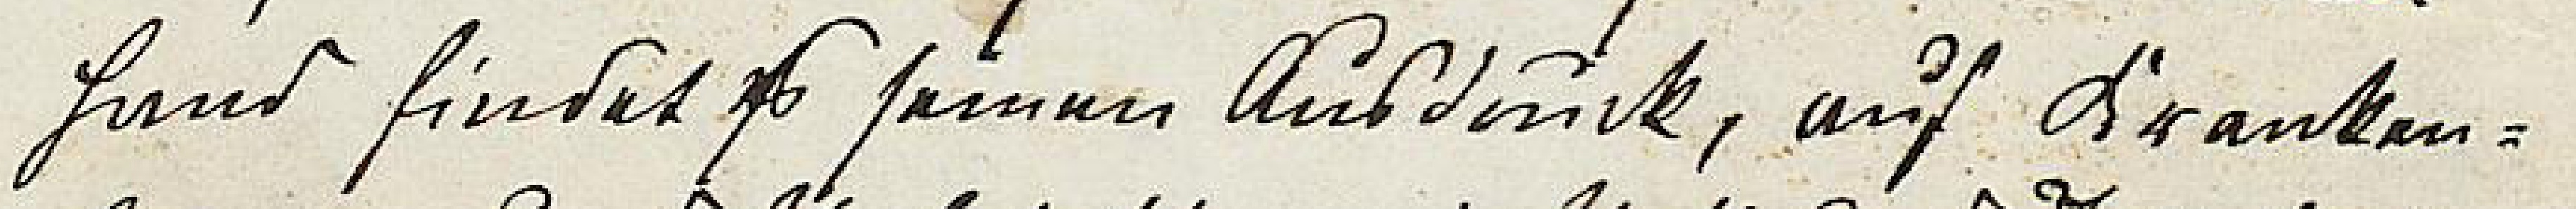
Hand findet es seinen Ausdruck, auf Kranken¬
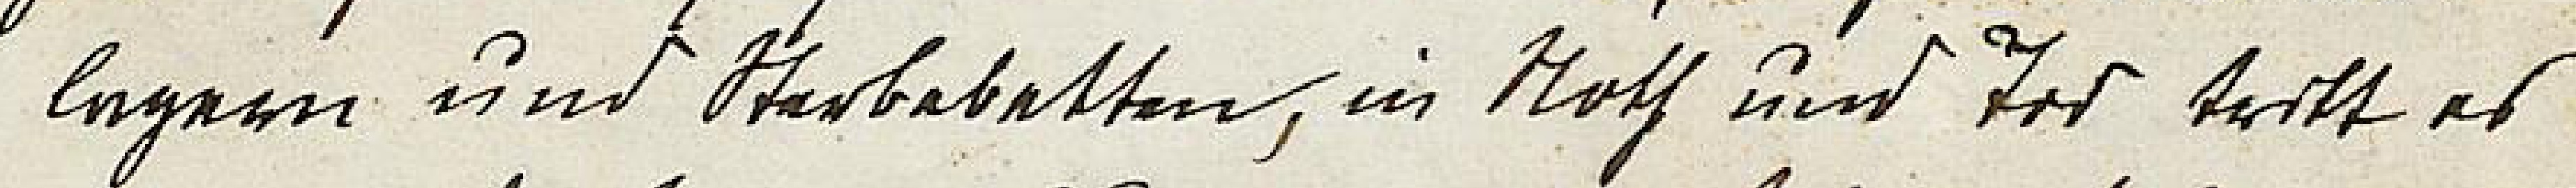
lagern und Sterbebetten, in Noth und Tod tritt es
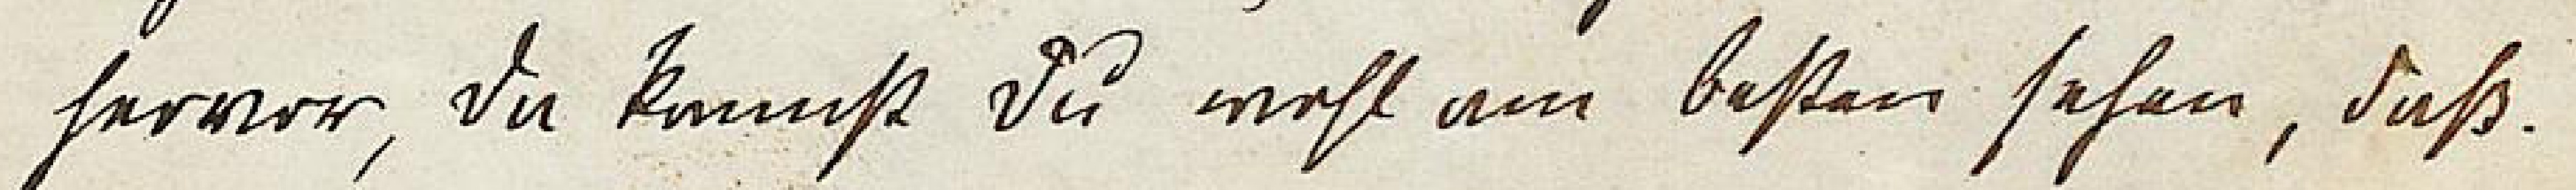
hervor, da kannst du wohl am besten sehen, daß
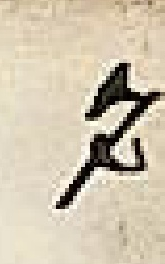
7
